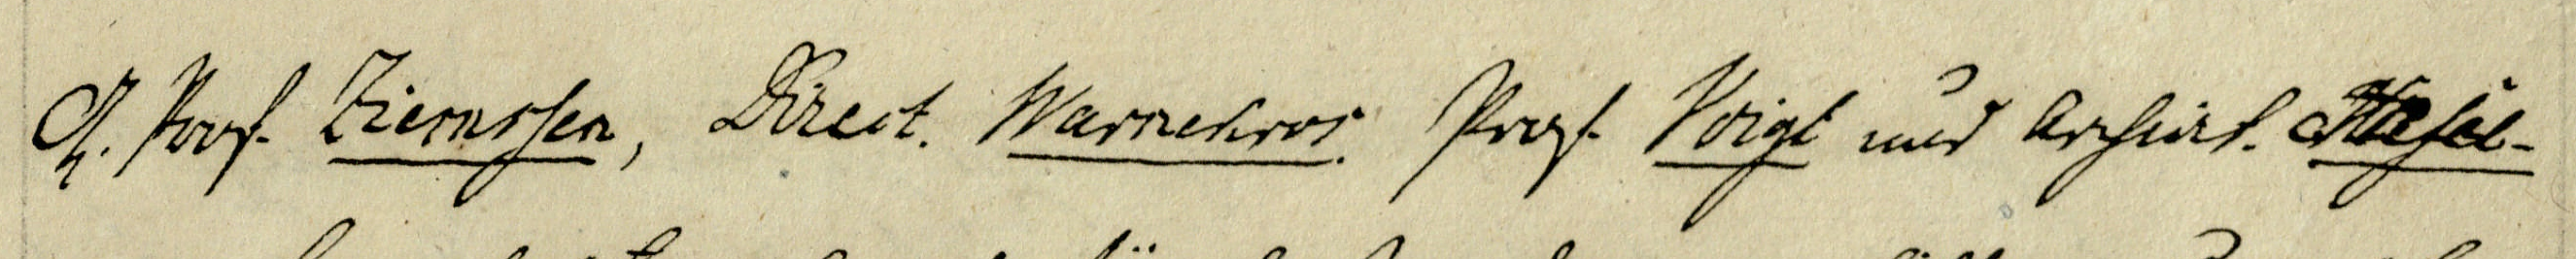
dh. Prof. Ziemssen, Direct. Warnekros Prof. Voigt und Archiat. Hasel¬
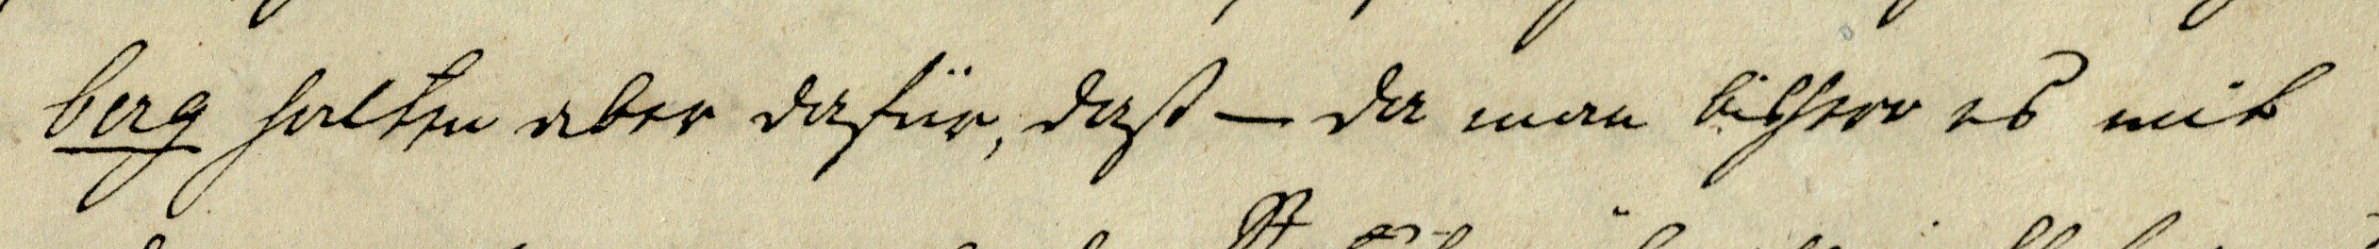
berg halten aber dafür, daß da man bishero es mit
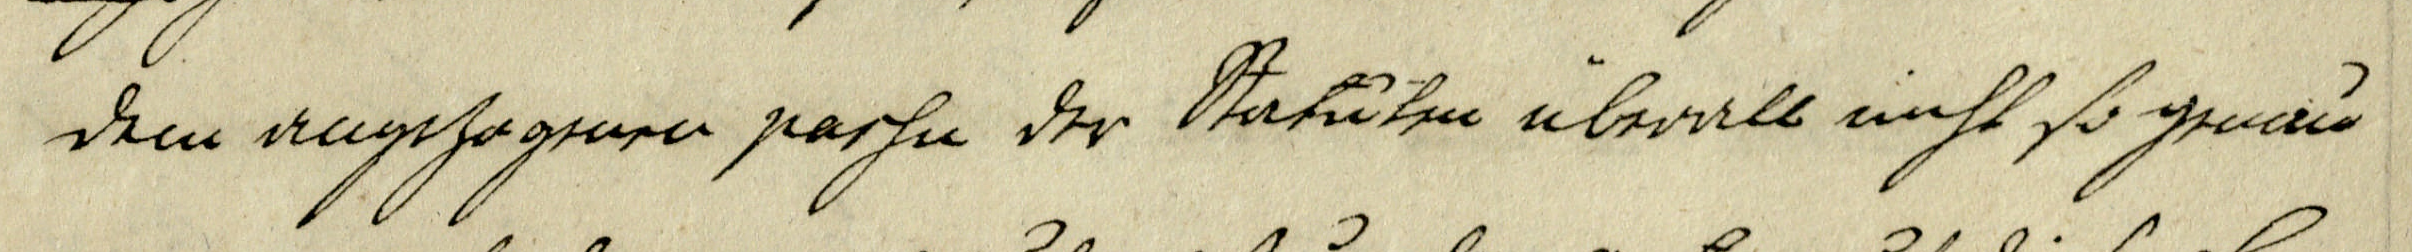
dem angezogenen passu der Statuten überall nicht so genau
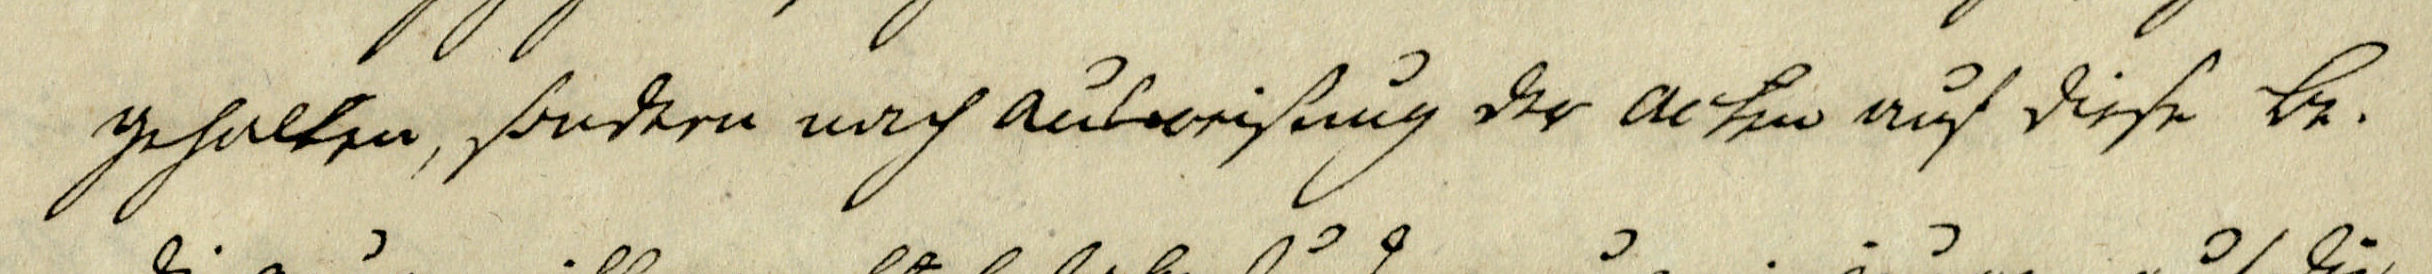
gehalten, sondern nach Ausweisung der Acten auf diese Be¬
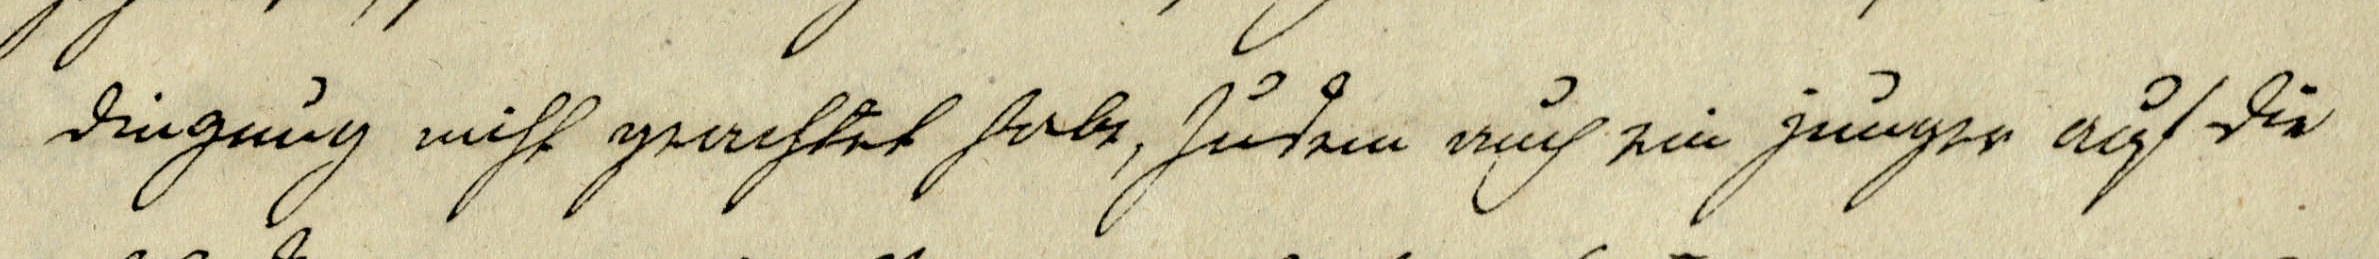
digung nicht geachtet habe, zudem auch ein junger auf die
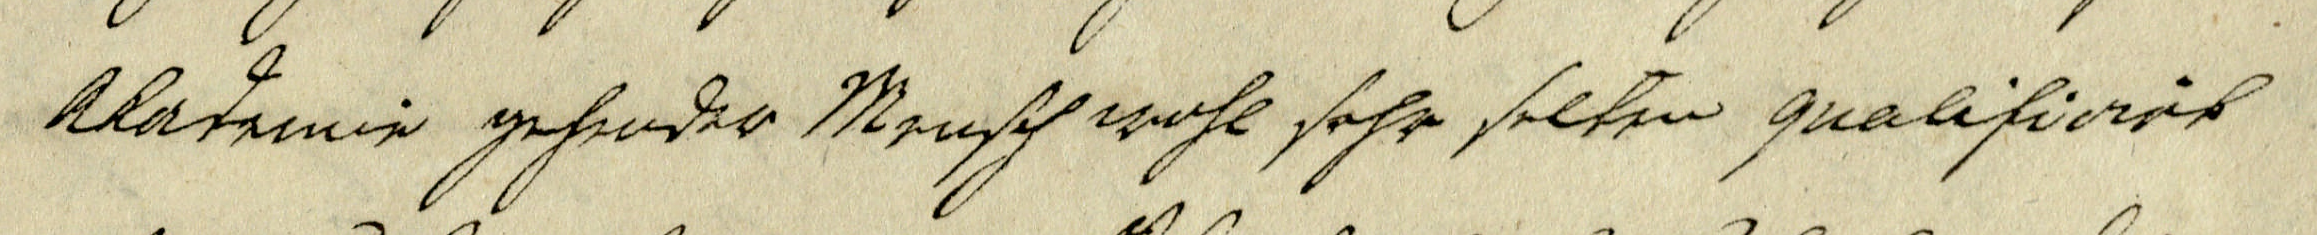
Akademie gehender Mensch wohl sehr selten qualificirt
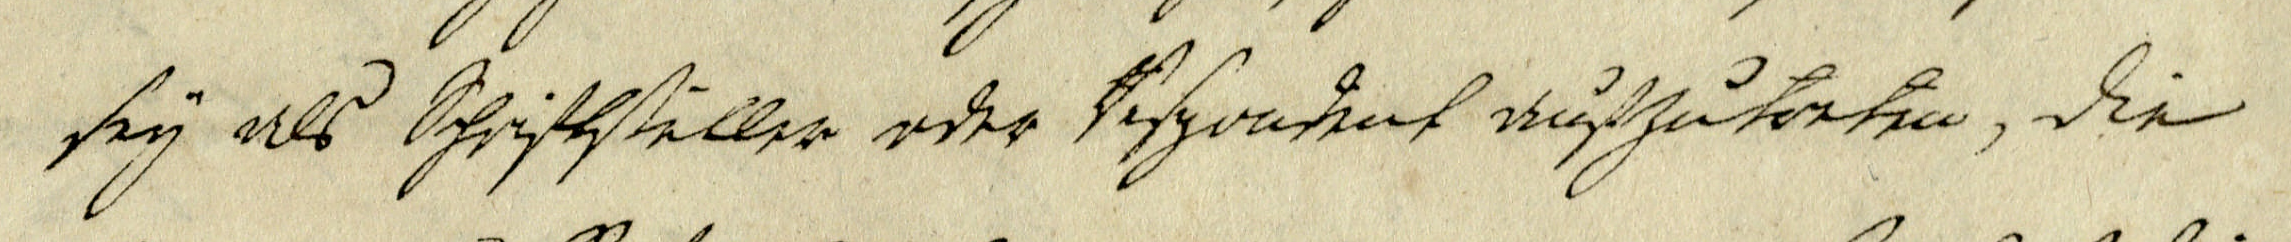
seÿ als Schriftsteller oder Respondent aufzutreten, die
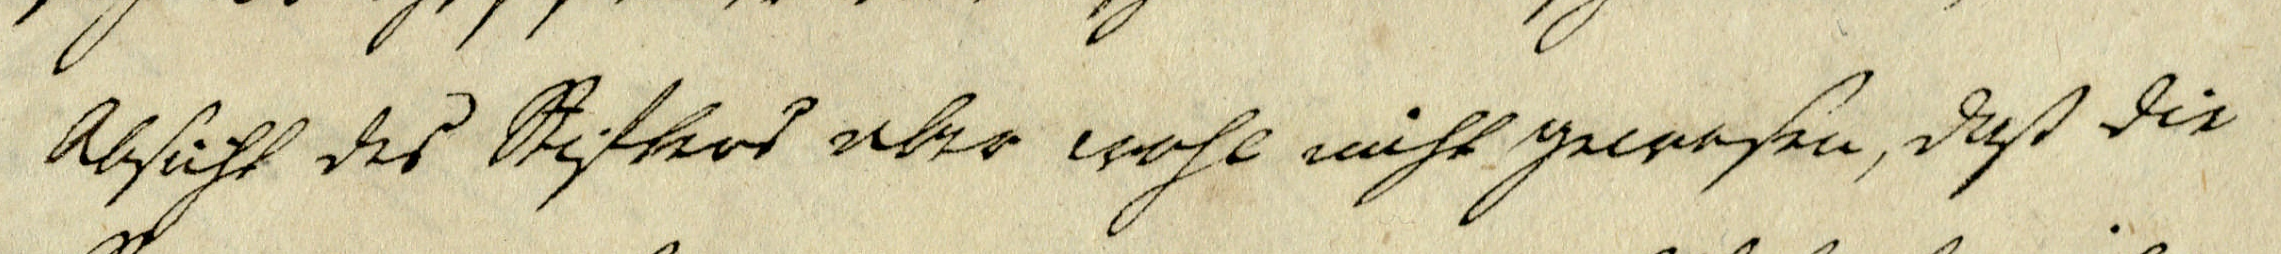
Absicht des Stifters aber wohl nicht gewesen, daß die
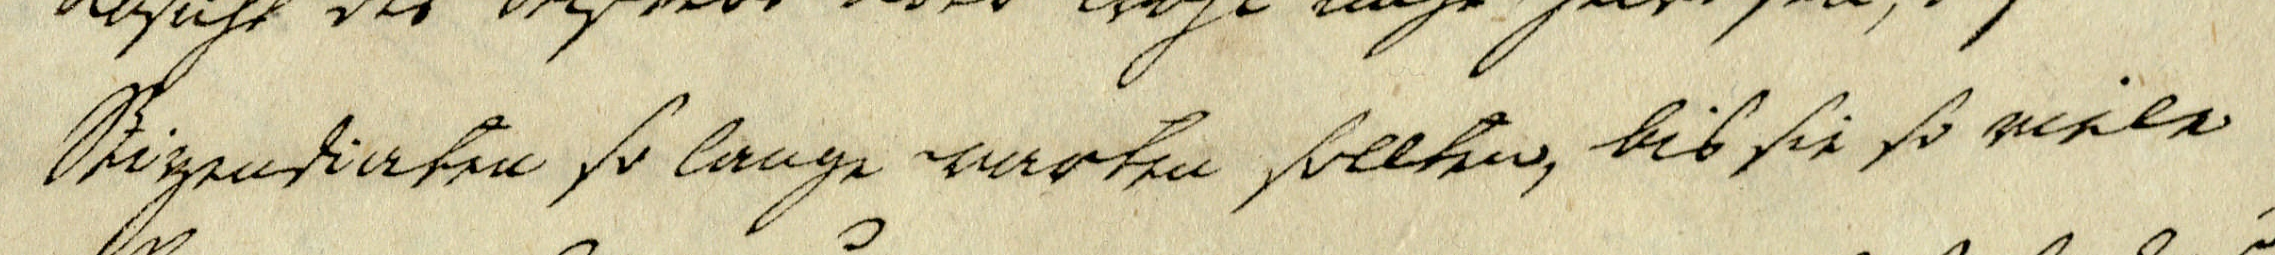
Stipendiaten so lange warten sollten, bis sie so viele
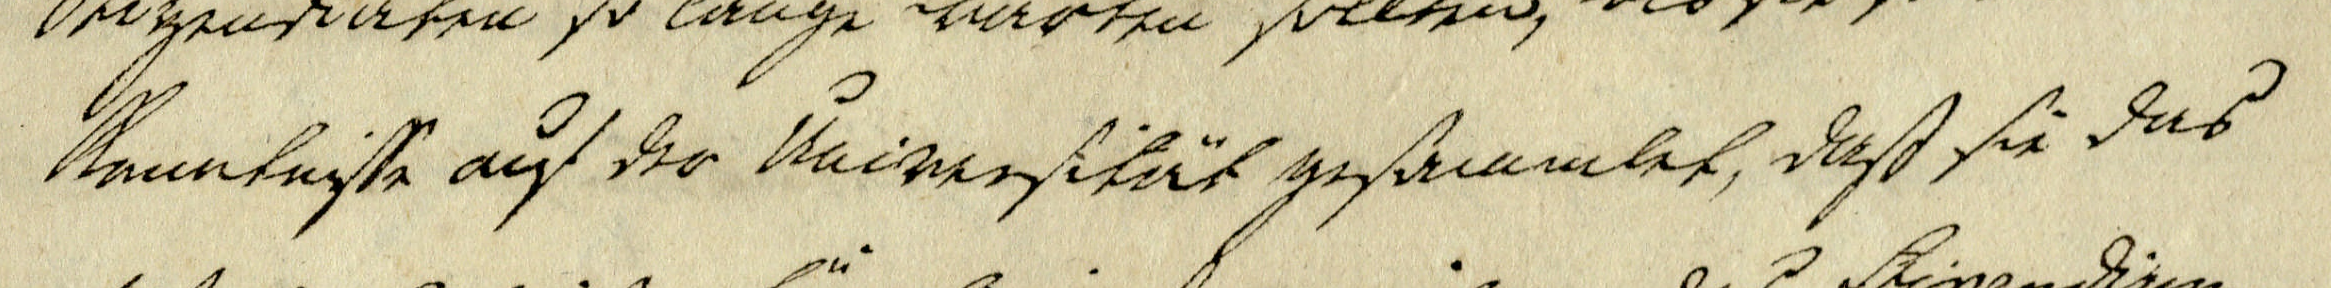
Kenntnisse auf der Universität gesammlet, daß sie das
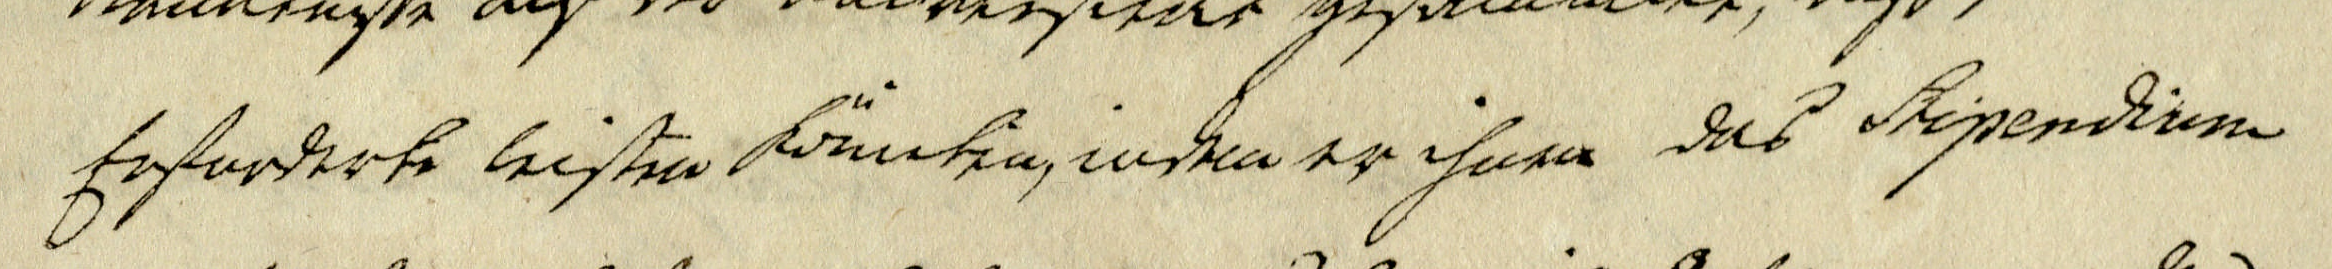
Erforderte leisten könnten, indem er ihnen das Stipendium
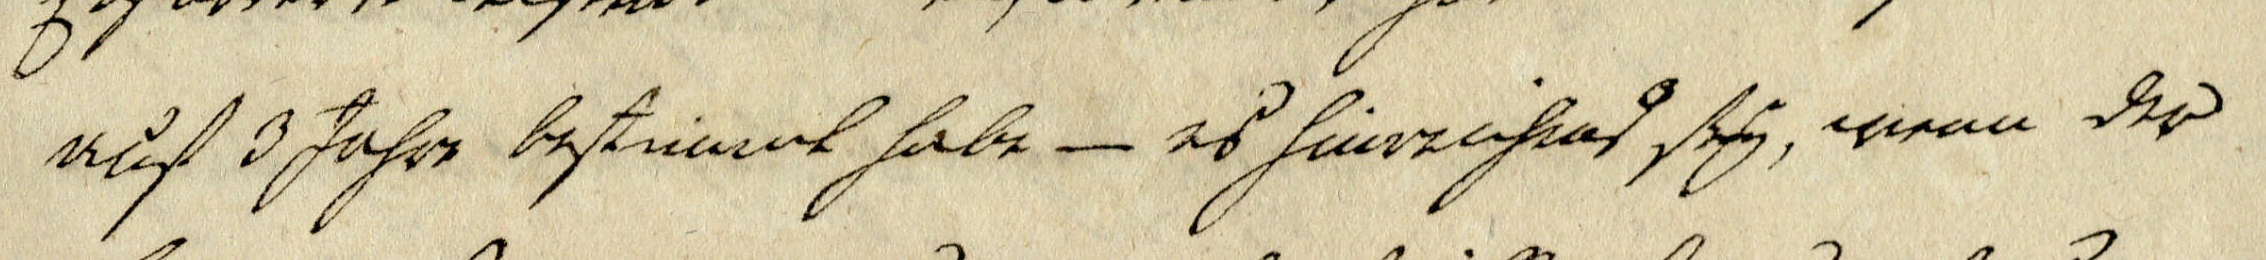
auf 3 Jahre bestimmt habe es hinreichend seÿ, wenn der
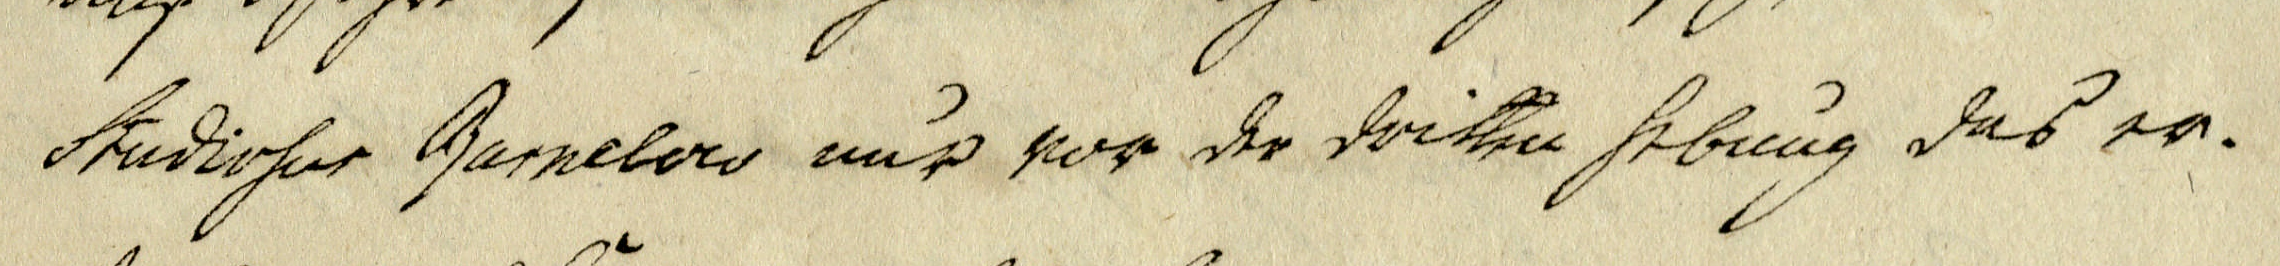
Studiosus Ramelow nur vor der dritten Hebung das er¬
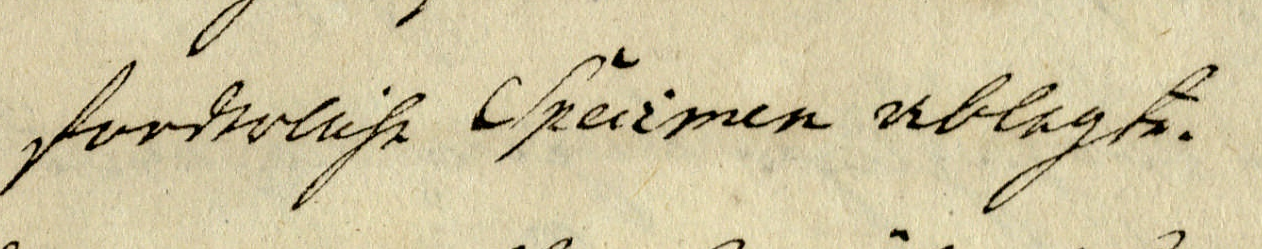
forderliche Specimen ablegte.
